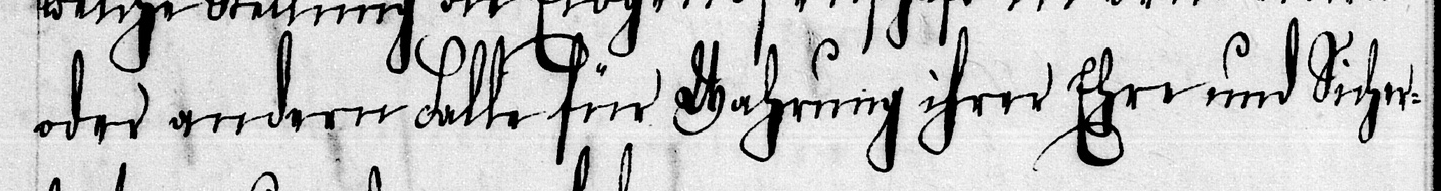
oder andern Falle für Wahrung ihrer Ehre und Sich¬
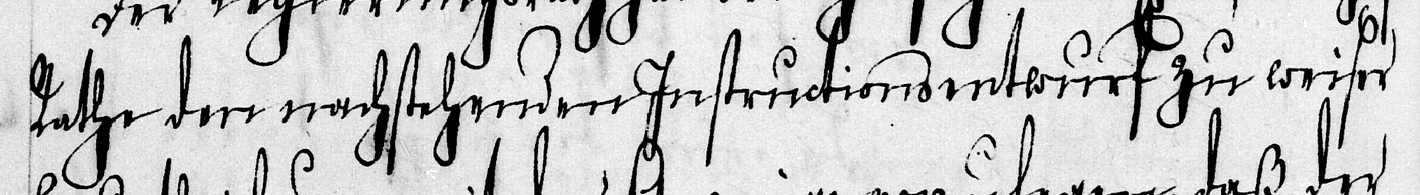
Rathe den nachstehenden Instructionsentwurf zu weiser
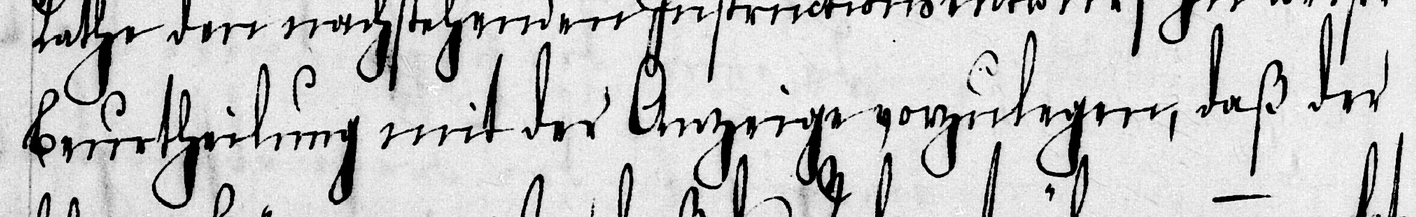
Beurtheilung mit der Anzeige vorzulegen, daß der
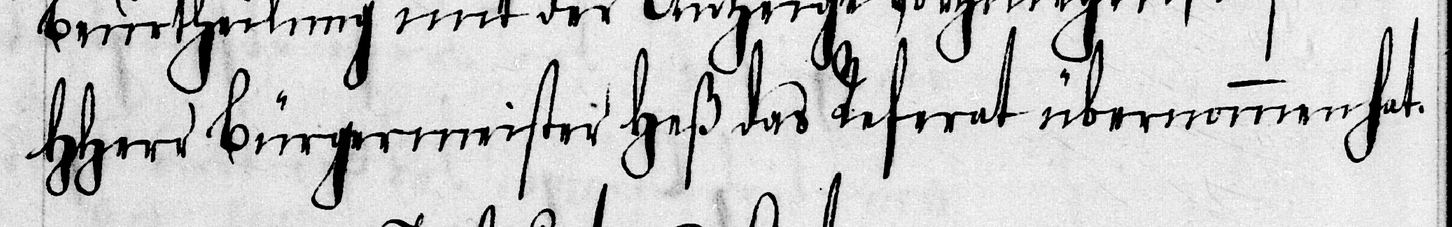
HHerr Bürgermeister Heß das Referat übernommen ha¬
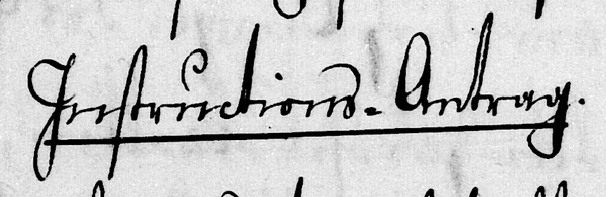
Instructions-Antrag.
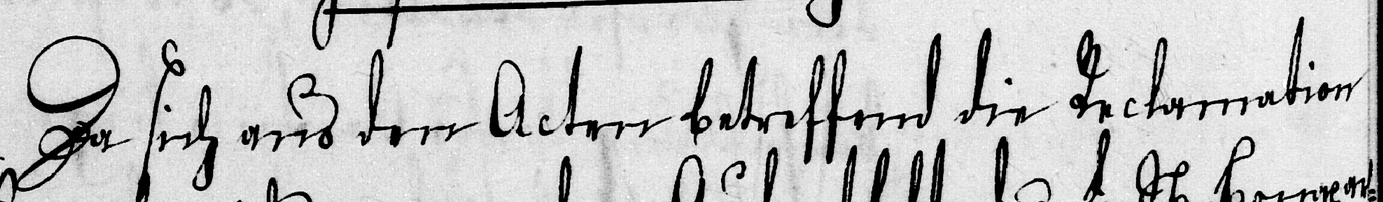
Da sich aus den Acten betreffend die Reclamation
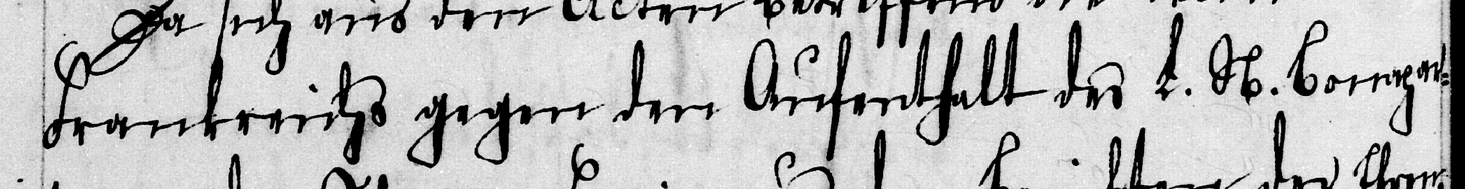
Frankreichs gegen den Aufenthalt des L. N. Bonapar¬
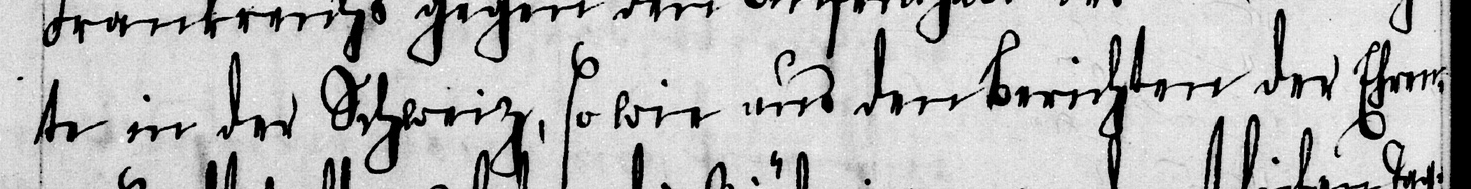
te in der Schweiz, so wie aus den Berichten der Ehren¬
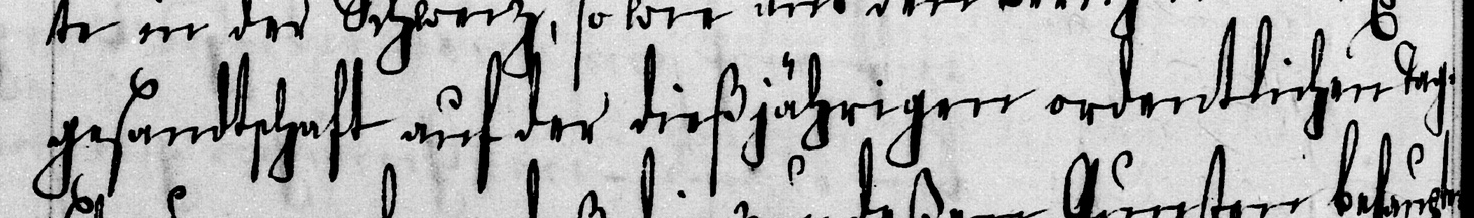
gesandtschaft auf der dießjährigen ordentlichen T¬
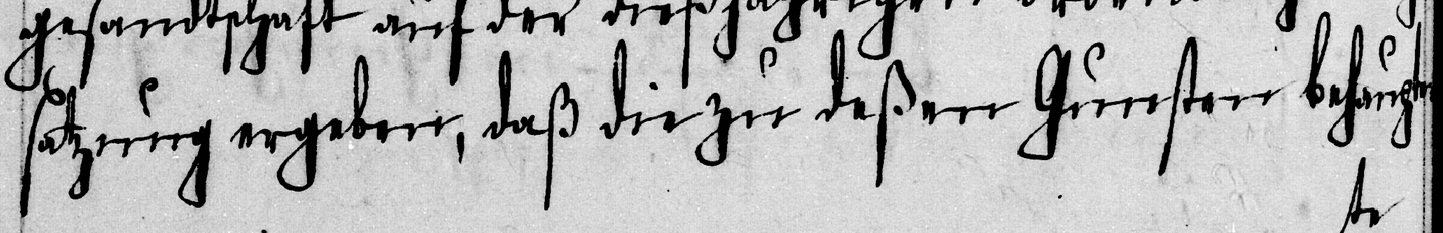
satzung ergeben, daß die zu deßen Gunsten behau¬
